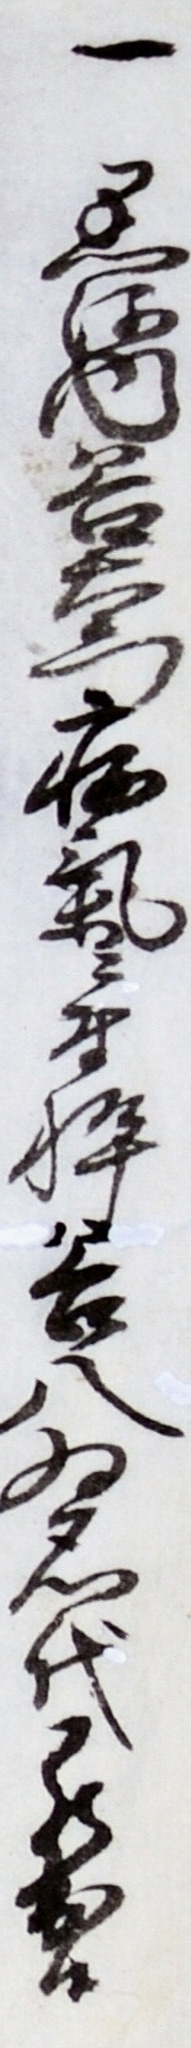一黒河内善右衛門病気ニ付倅善八為名代罷出候
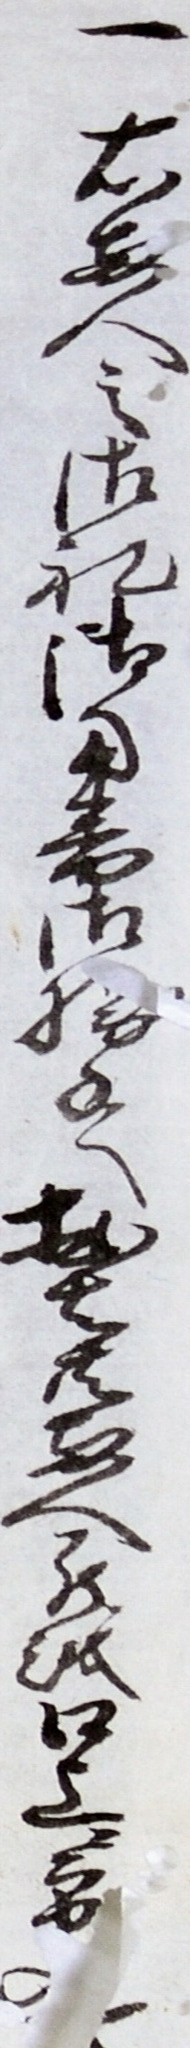一右両人之御礼御用番御勝手へ杣者共両人罷越口上ニ而由
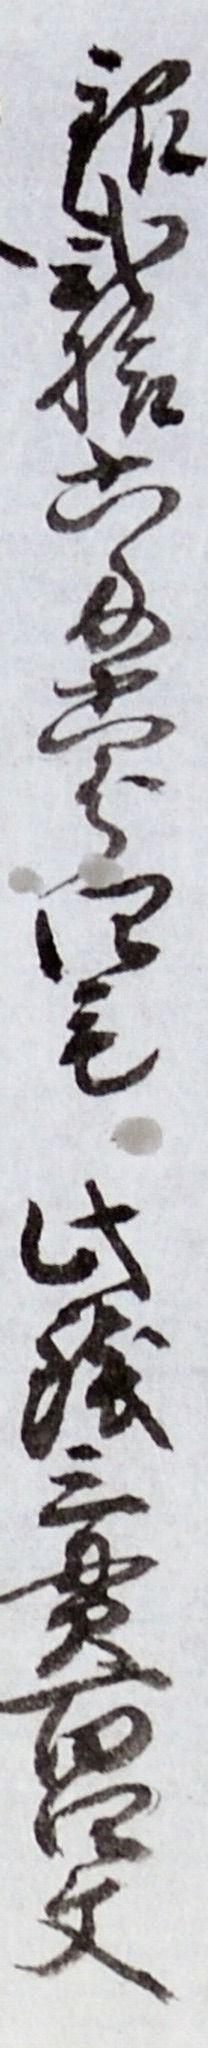銀弐拾六匁六分四毛此銭三貫百四文
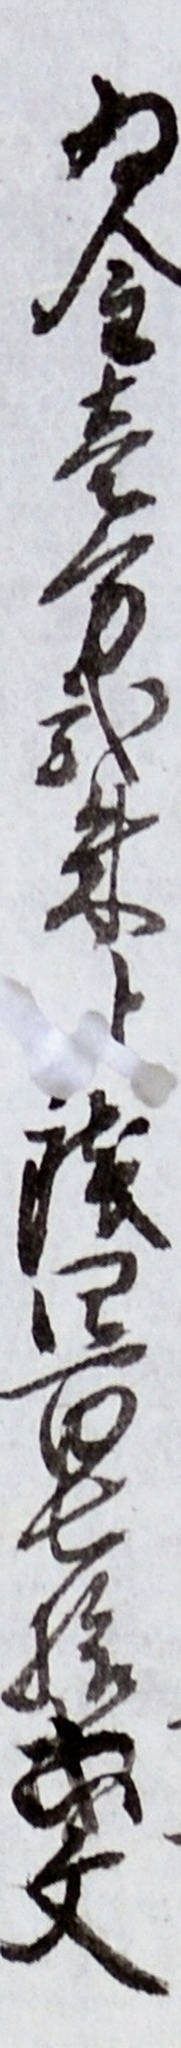為金壱分弐朱ト銭四百七拾弐文
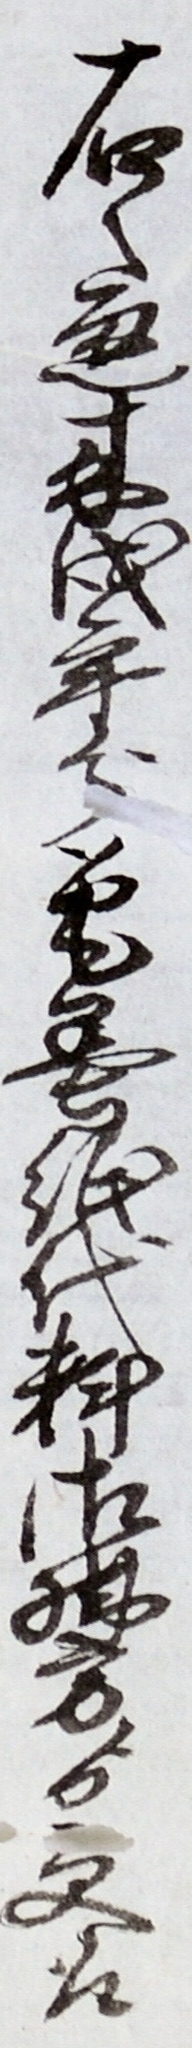右之通来戌年分筆墨紙代料御払方より受取
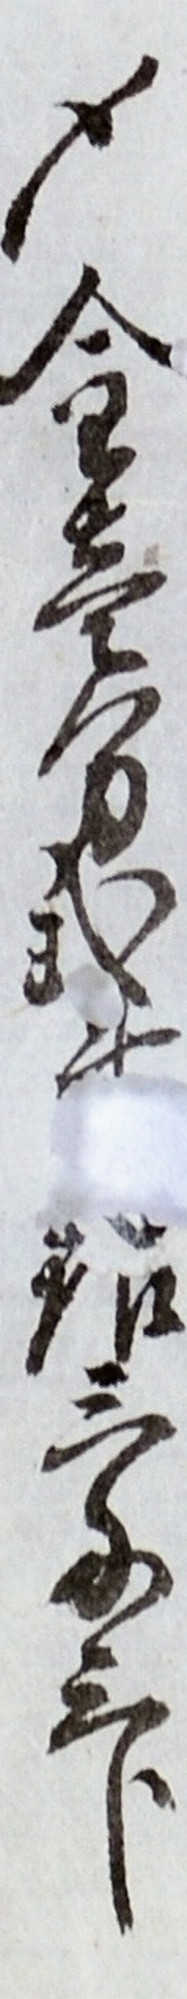〆金壱分弐朱カ銀三匁三分
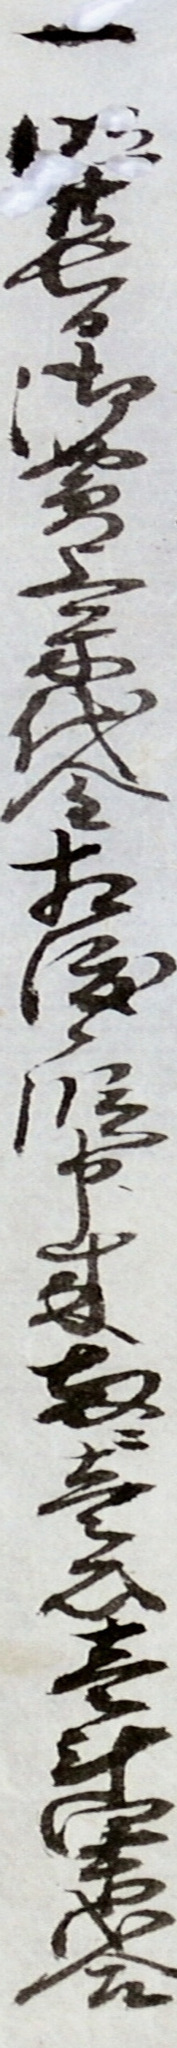一昨廿七日御買上米代金相渡候段申来毎ニ壱石壱斗四升弐合
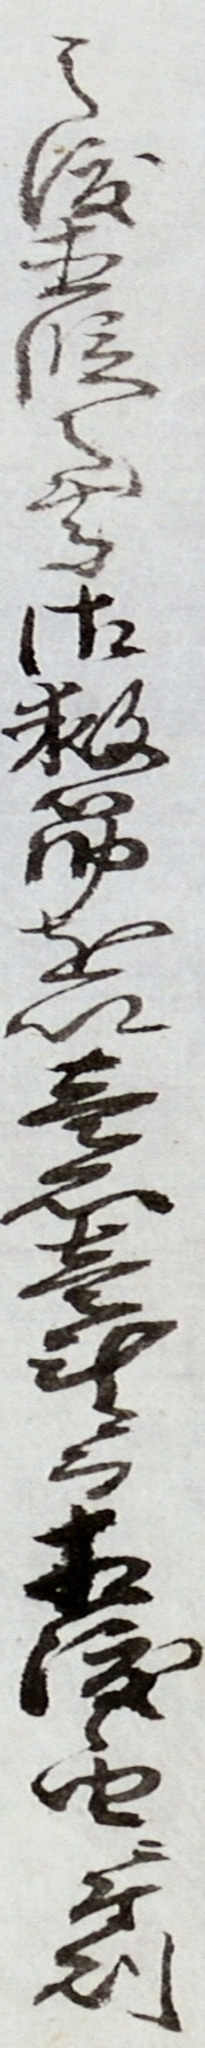之渡直段之処御救筋を以壱石壱斗ニ而相渡候由ニ付則
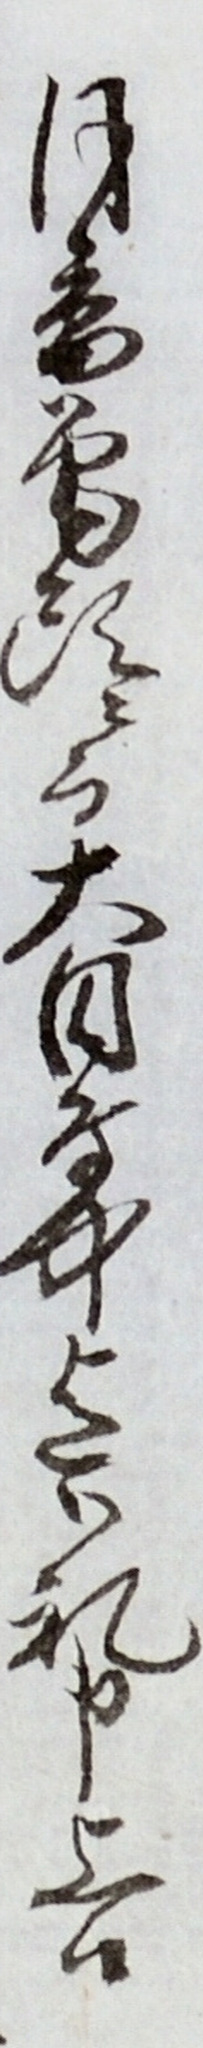月番筆頭ニ而大目付中迄御礼申上候
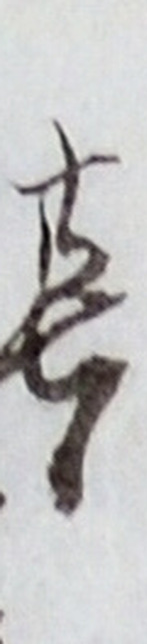廿七日
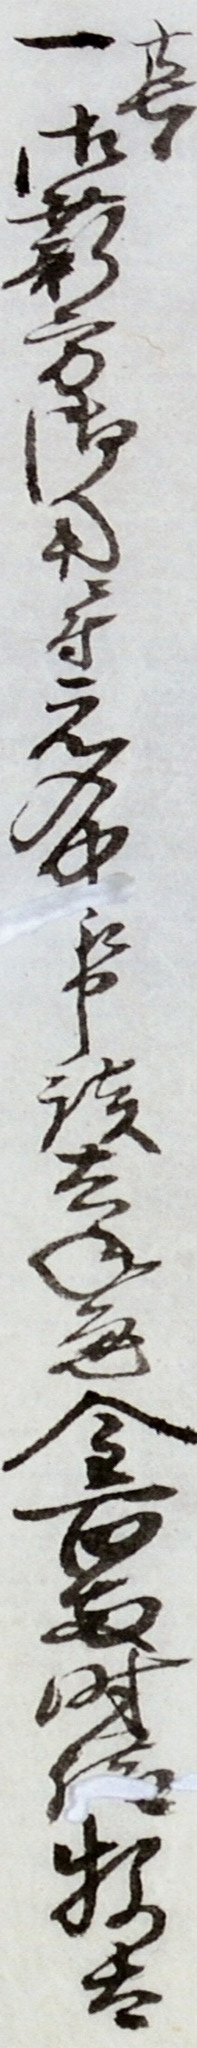一御薪方御用ニ付元〆中江申談去年通金百両時牧太
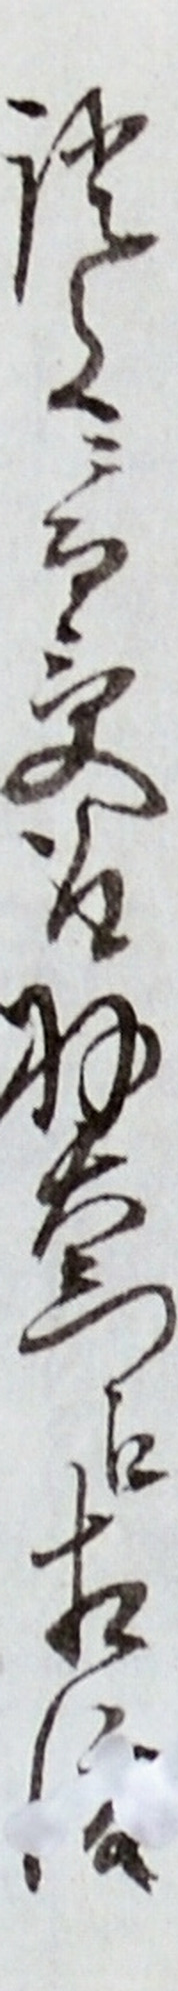証文ニ而受取羽右衛門江相渡
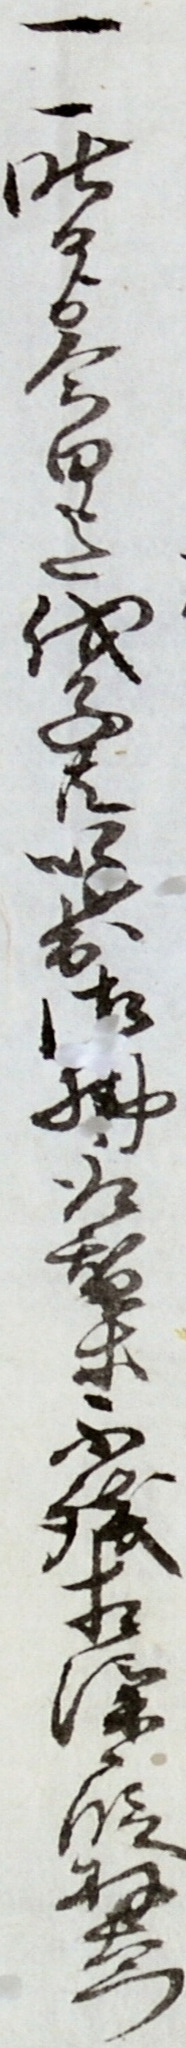一昨日より今日迄伐子共呼出御払取替等不残相済候段羽右衛門
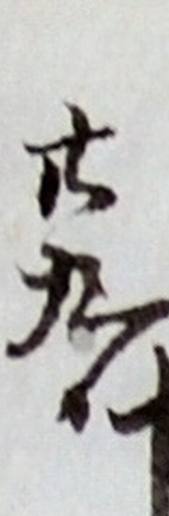廿九日
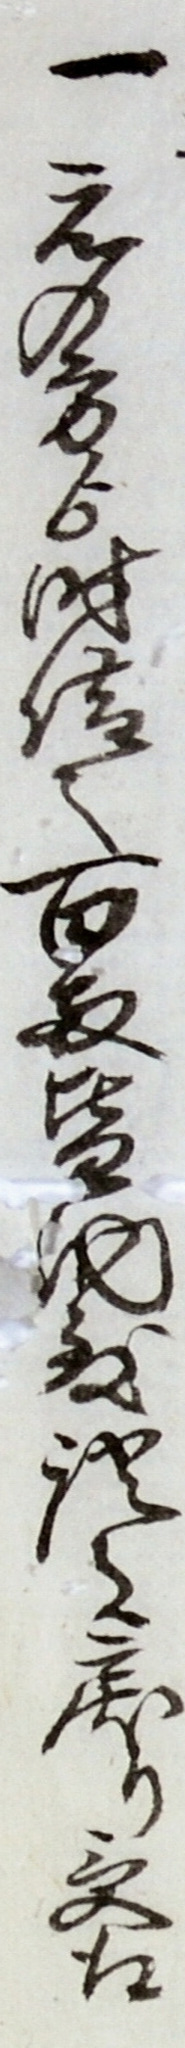一元〆方より時請之百両皆納致証立戻り受取

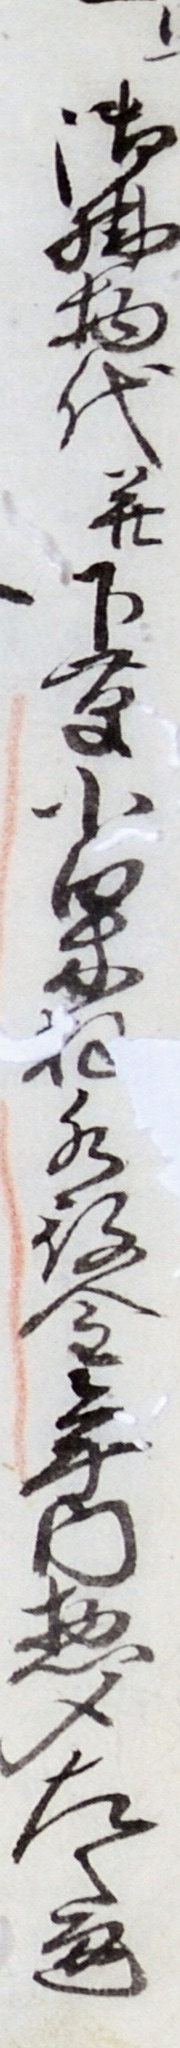一御掛惣代并下宜小白木水役今年内惣〆左之通
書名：御山奉行御用控
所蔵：伊那市立高遠町図書館・合同会社AMANE
